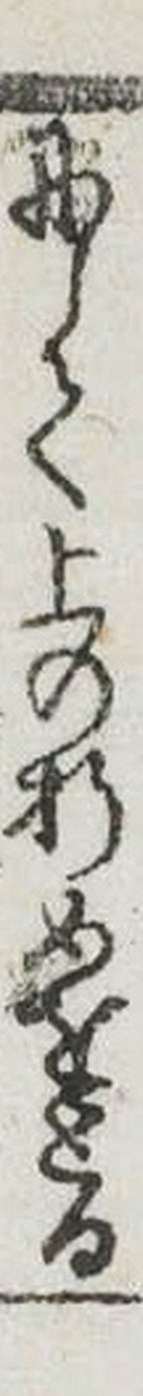にて上の折めをとる
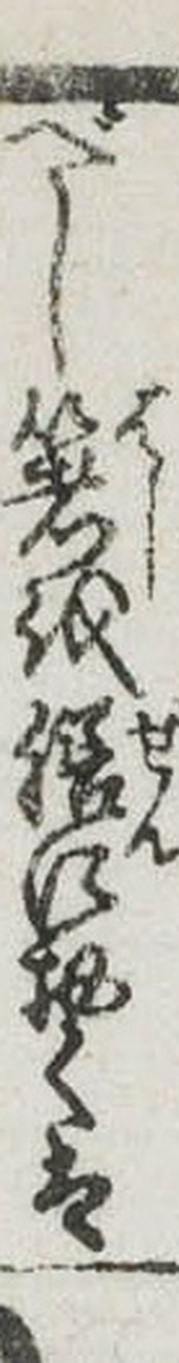べし箸を膳におくは
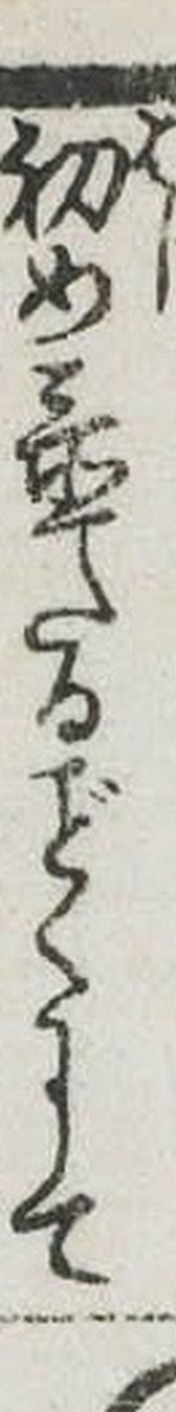初め置たるごとくにて
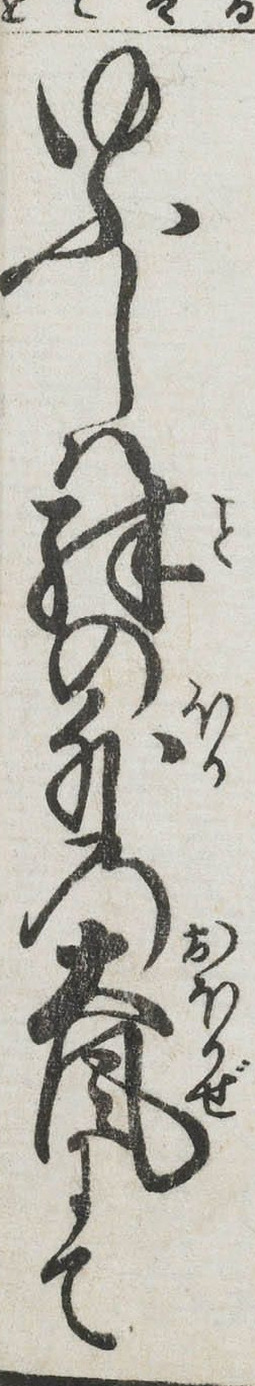ゆふしは殊の外の大風にて
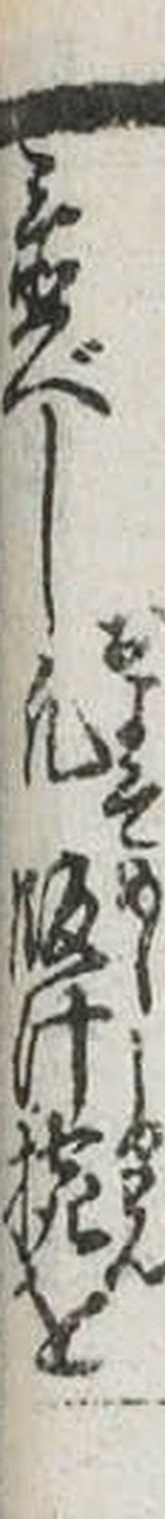置べし凡飯汁椀を
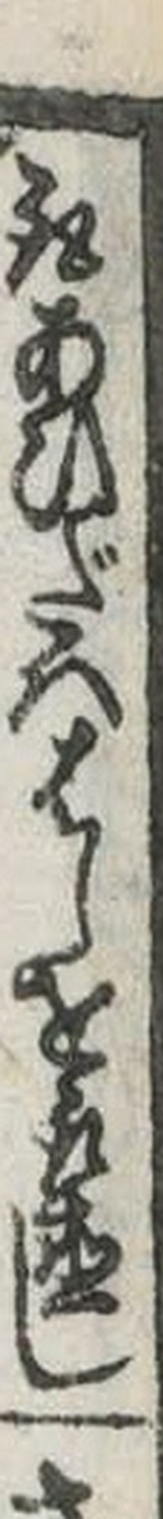取あひだははしを取直し
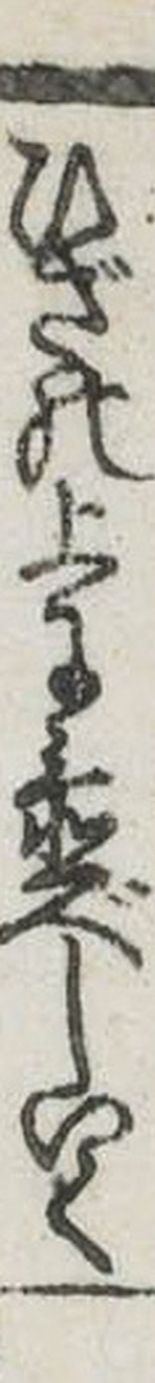ひざの上に置べしいく
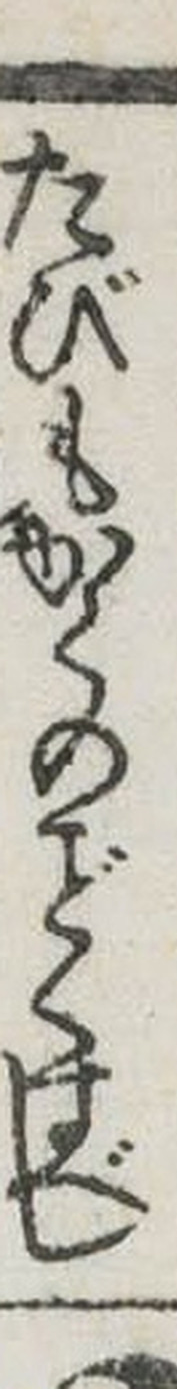たびもかくのごとくすべし
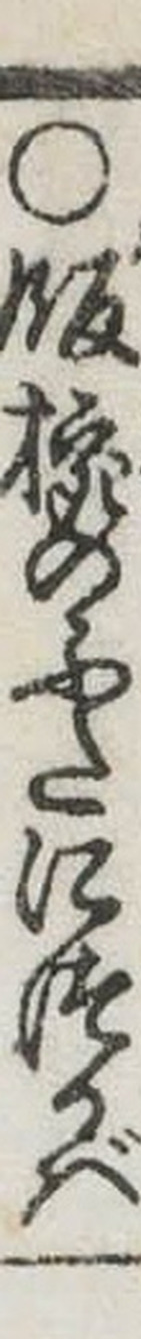○飯椀のふたにつかば
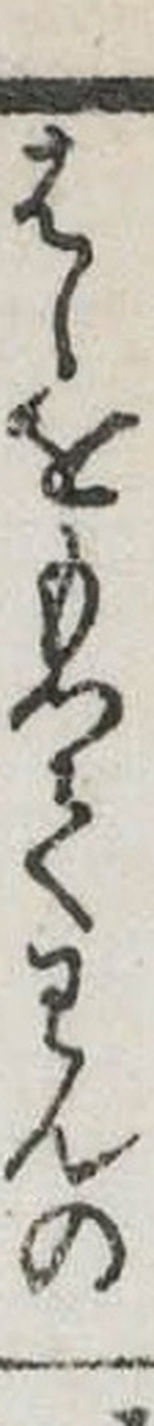はしをもつてわんの
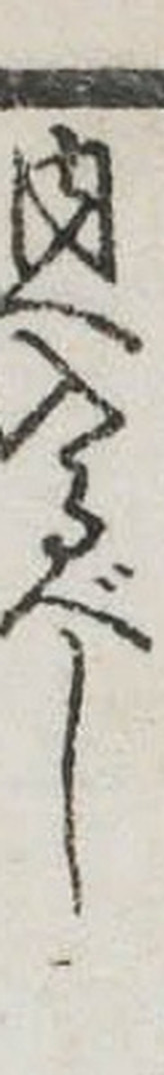内へ入るべし
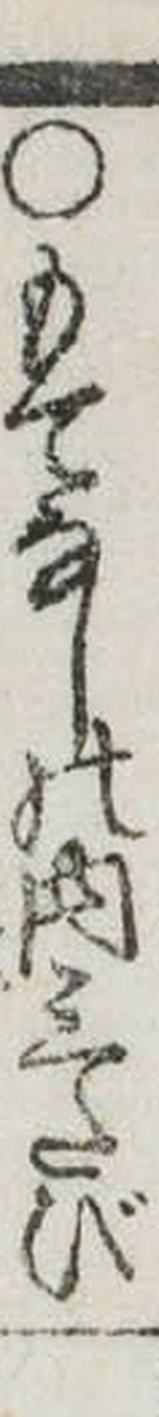○もてなしの内三たび
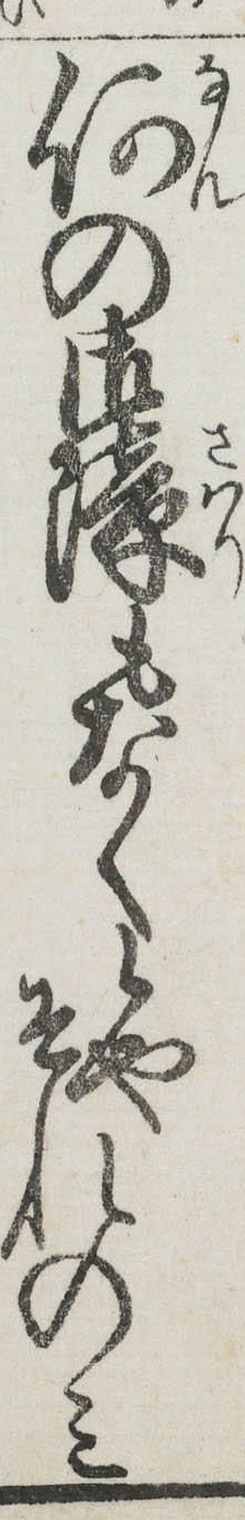何の御障もなく候やそれのみ
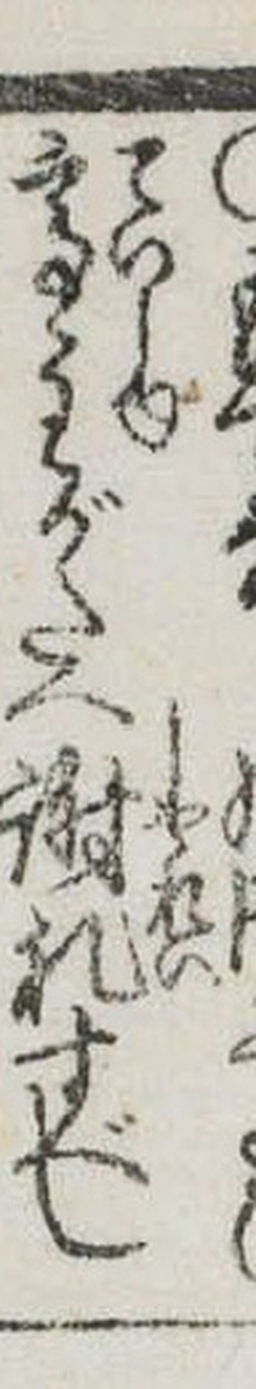亭主がたへ謝礼すべし
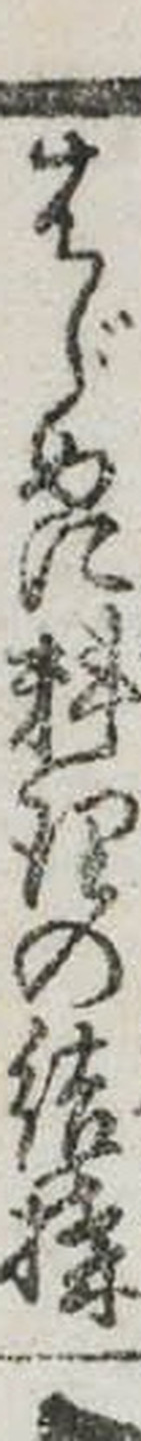はじめに料理の結構
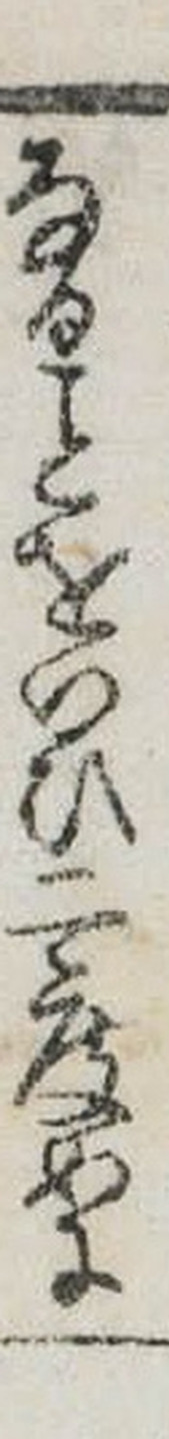なることをいひ二度めに
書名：頭書萬用婦人手紙之文言
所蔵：東京学芸大学教育コンテンツアーカイブ
